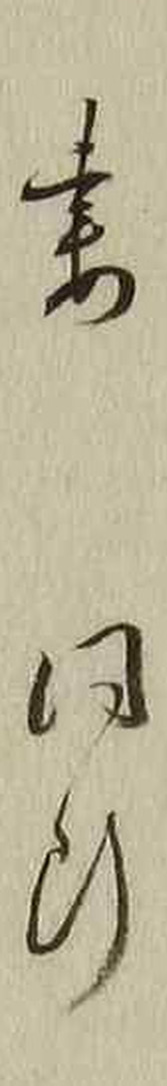妻同断
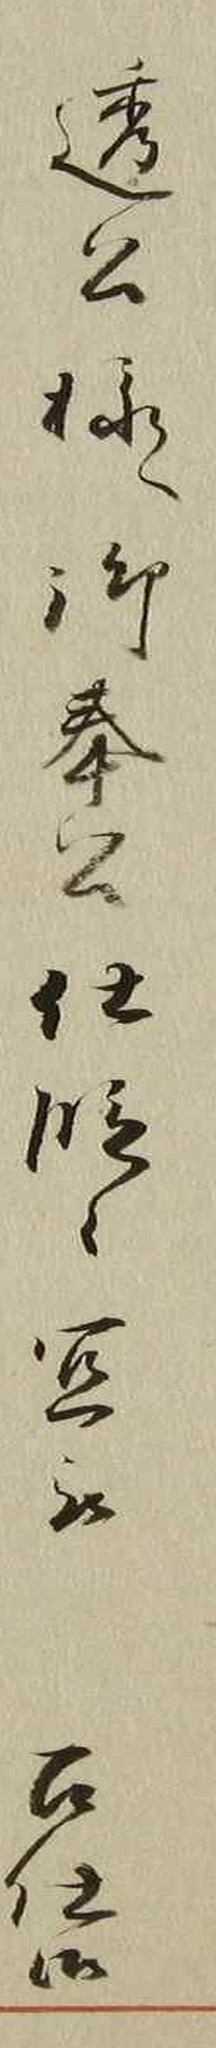透公様へ御奉公仕段々宜被召仕御
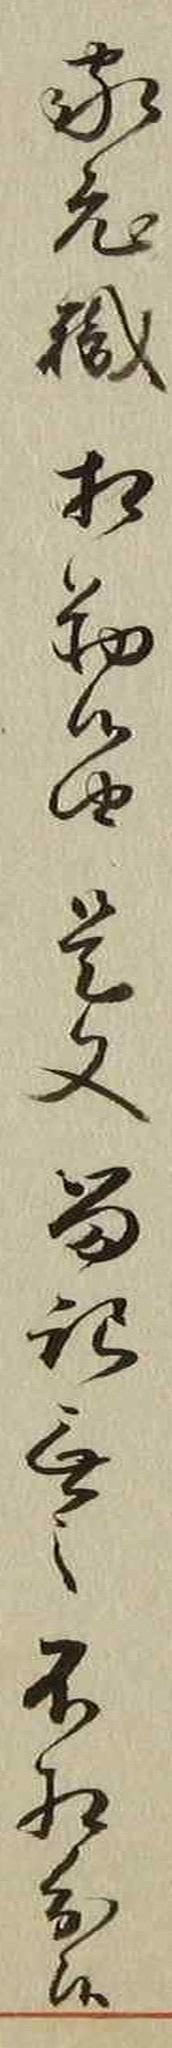家老職相勤候由是又留記無之不相分候
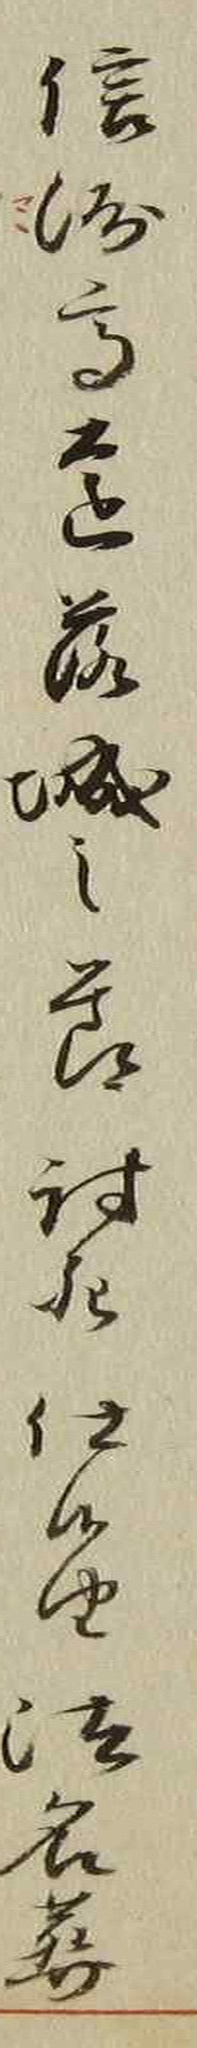信洲高遠落城之節討死仕候由法名葬
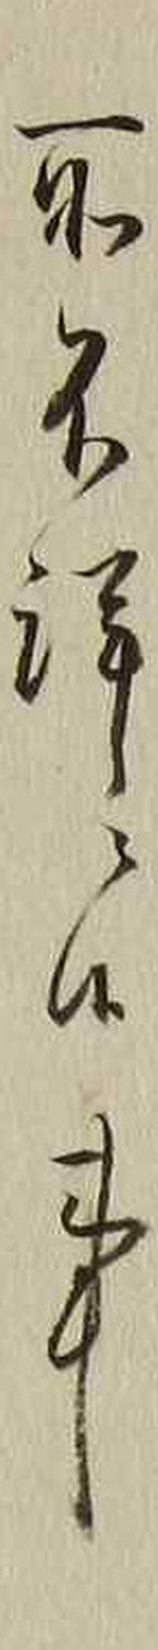所不詳ニ候事
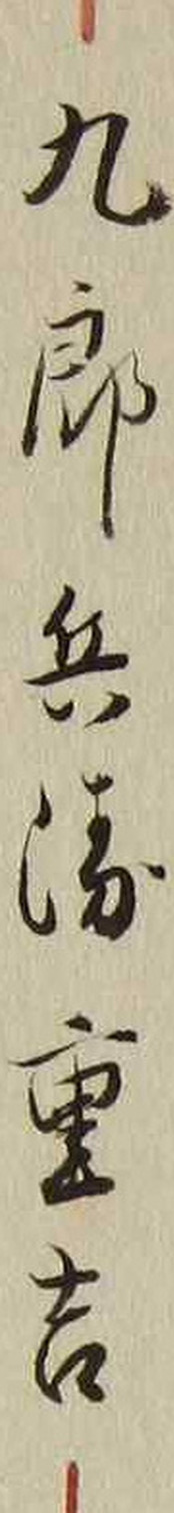九郎兵衛重吉
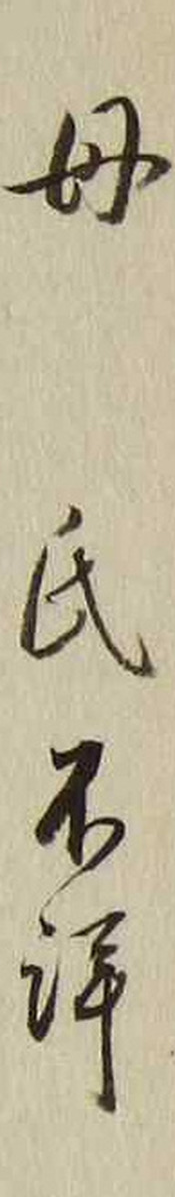母氏不詳

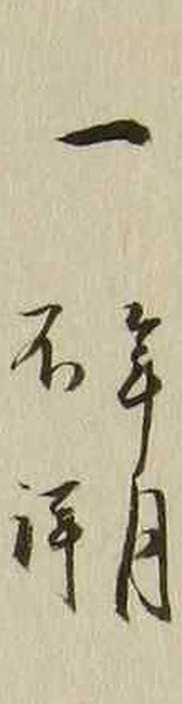一年月
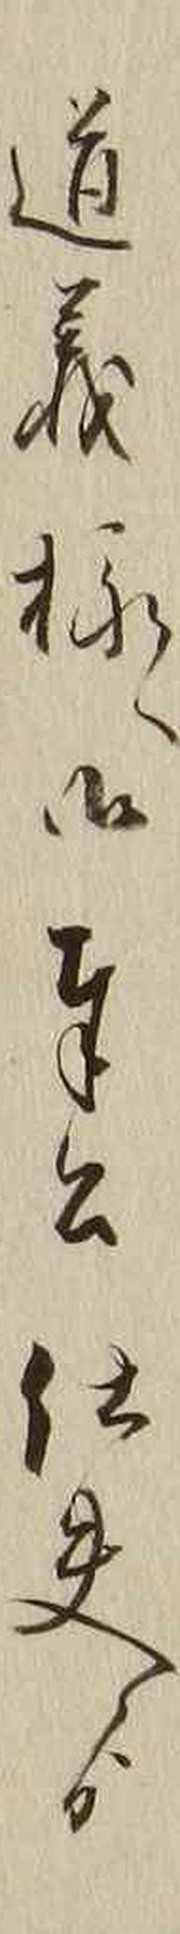道義様へ御奉公仕夫ゟ
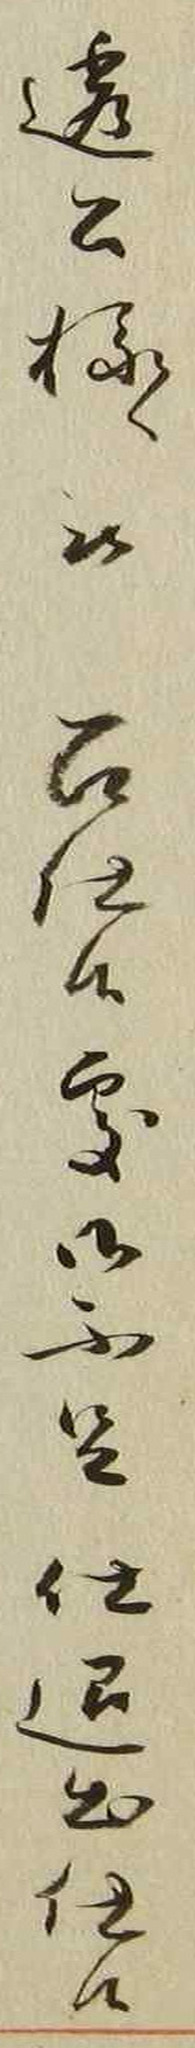透公様へ被召仕候処御不足仕退出仕候
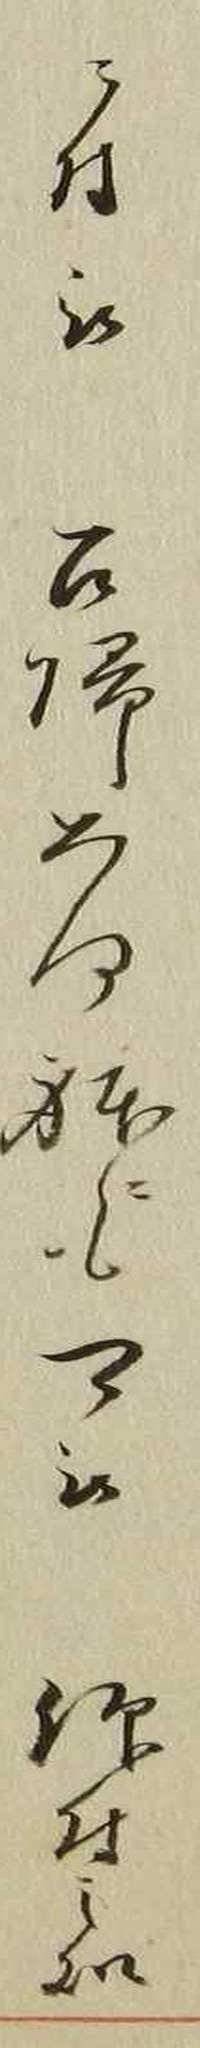ニ付被召帰如何躰にも可被仰付之処
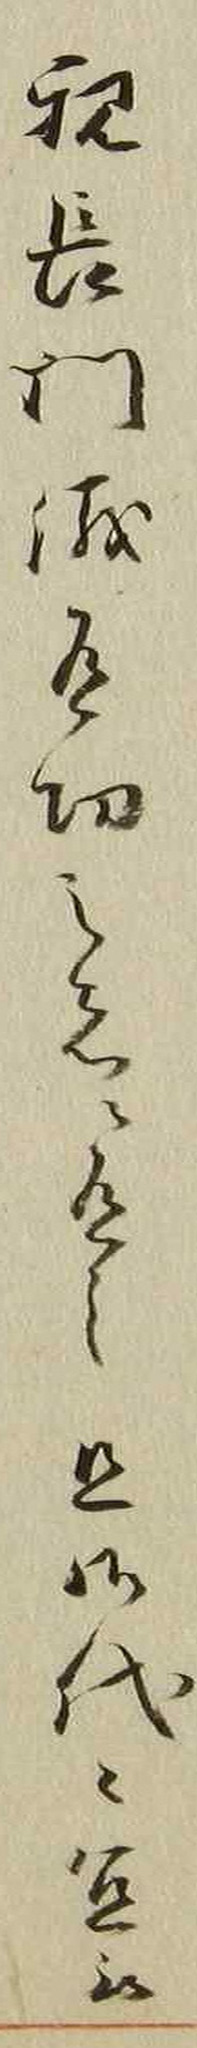親長門儀有功之者ニ有之且御代々宜被
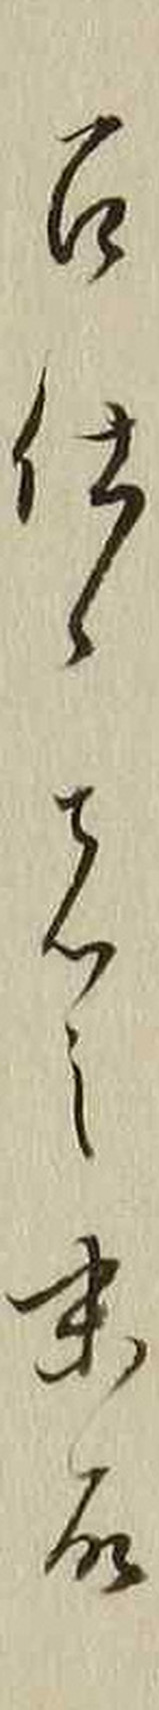召仕候者之末故
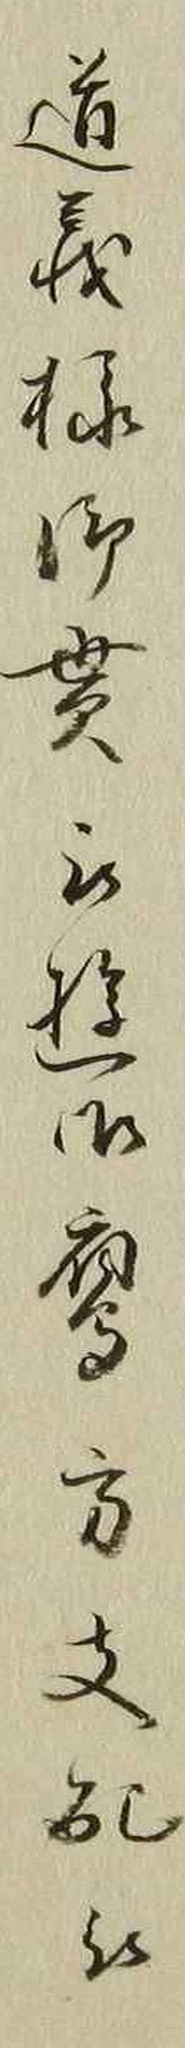道義様御貰被遊御鷹方支配被
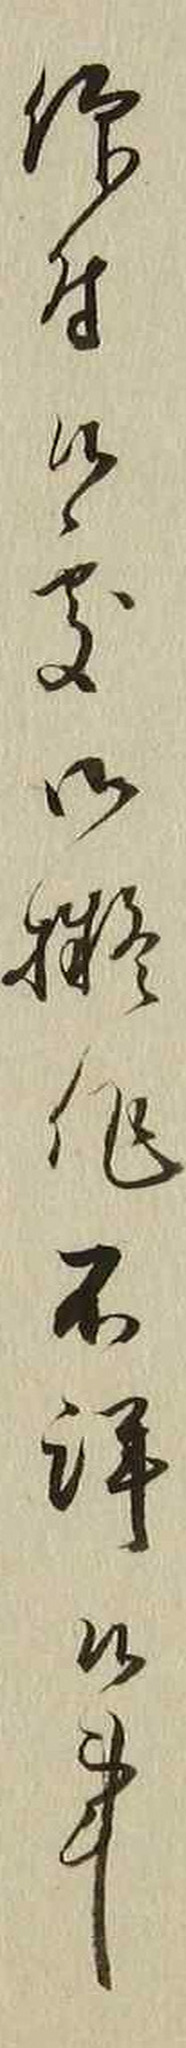仰付候処御擬作不詳候事
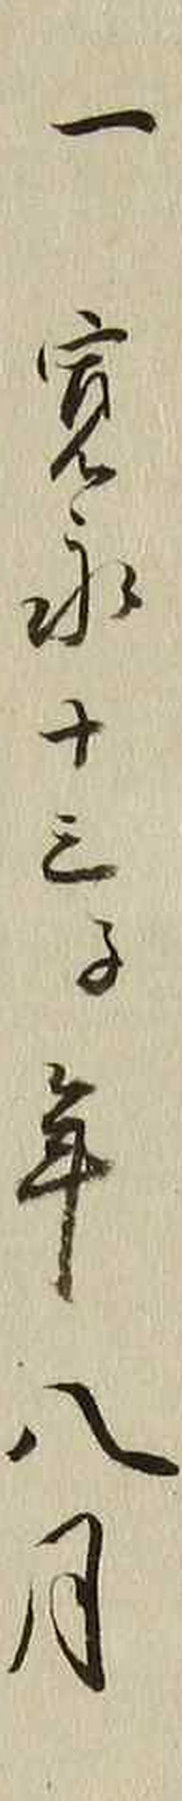一寛永十三子年八月
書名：諸士系譜　巻之32　い之部32
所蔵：会津若松市立会津図書館
